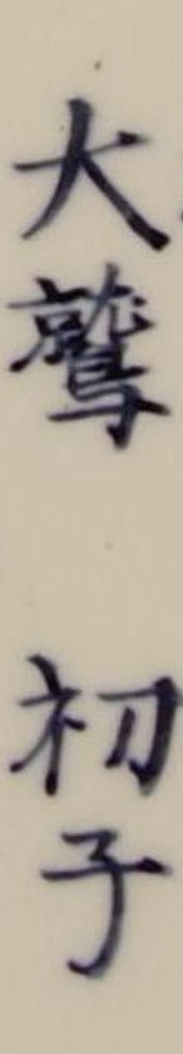大鷲初子
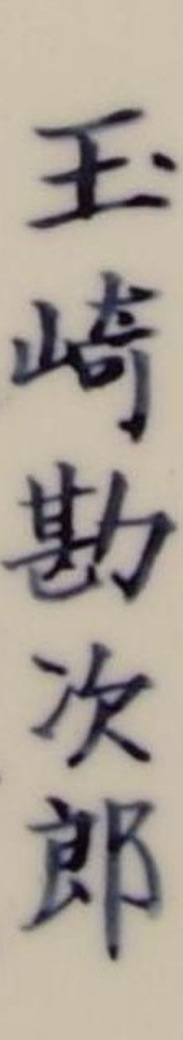玉崎勘次郎
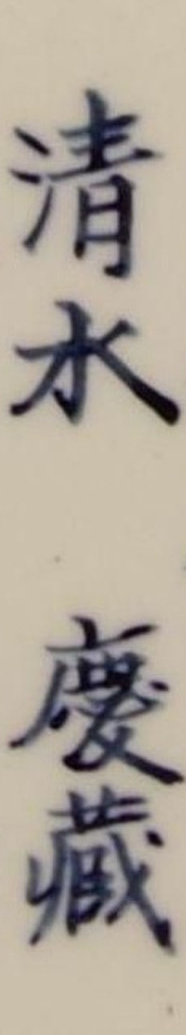清水慶蔵
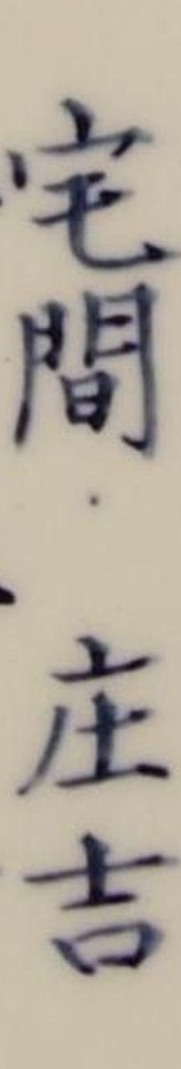宅間庄吉
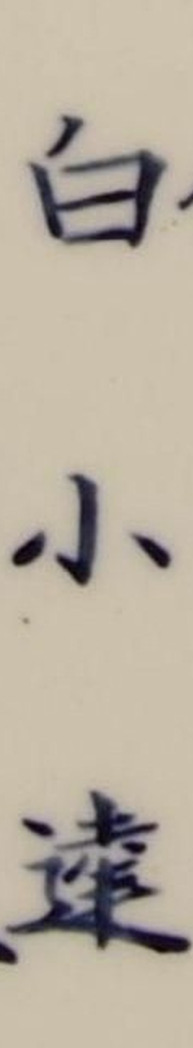白小達
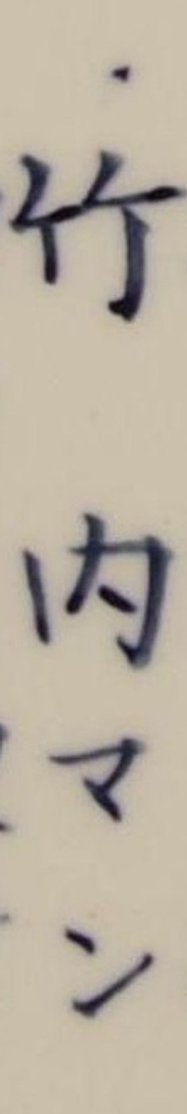竹内マン
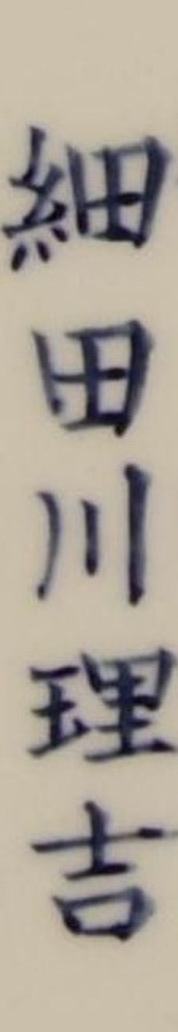細田川理吉
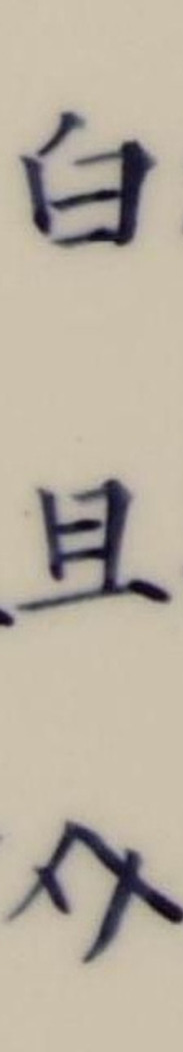白且介
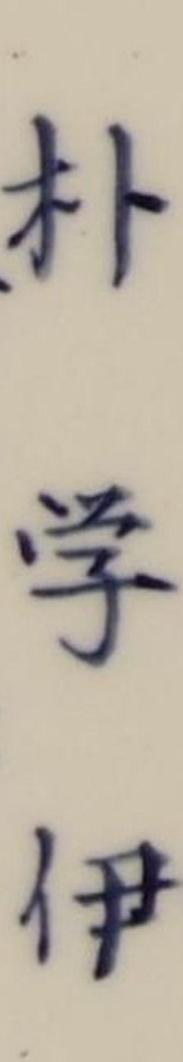朴学伊
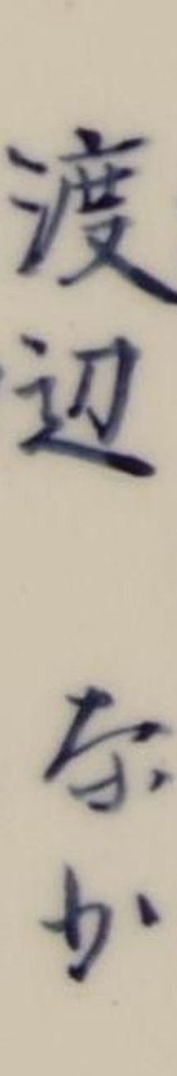渡辺なか
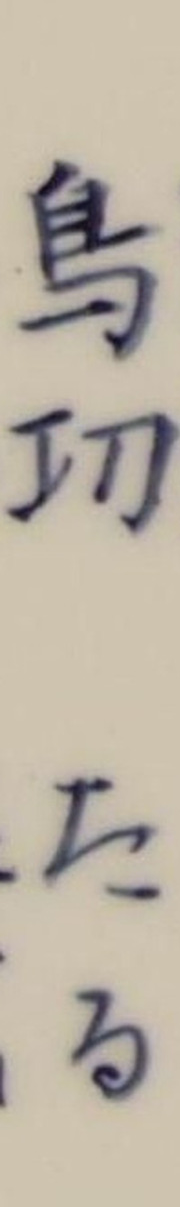鳥切たる
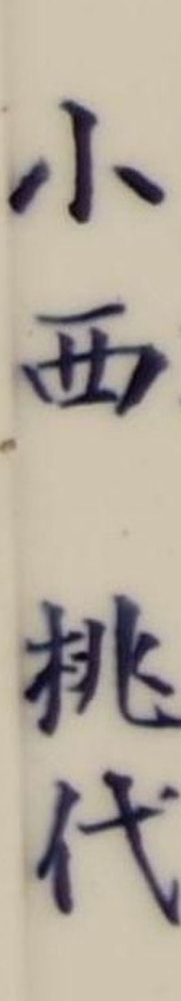小西桃代

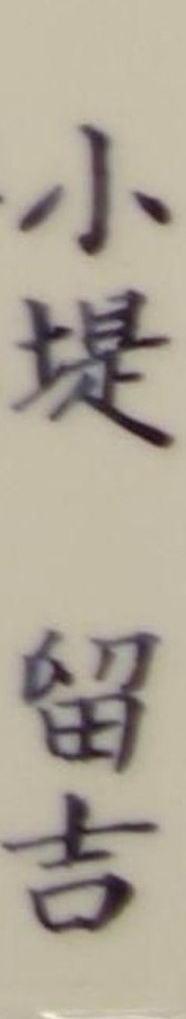小堤留吉
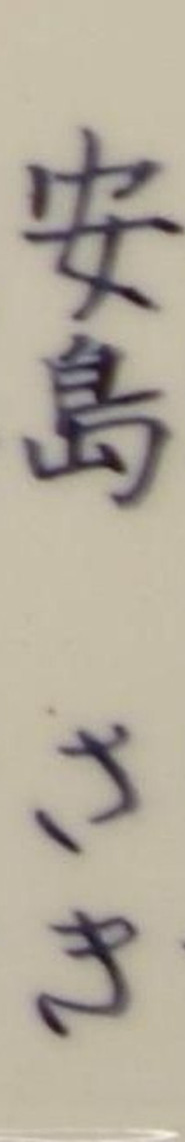安島さき
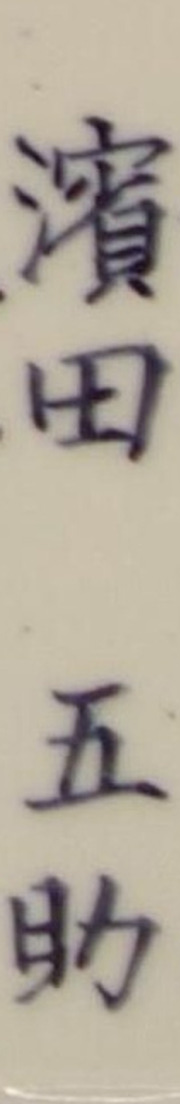濱田五助
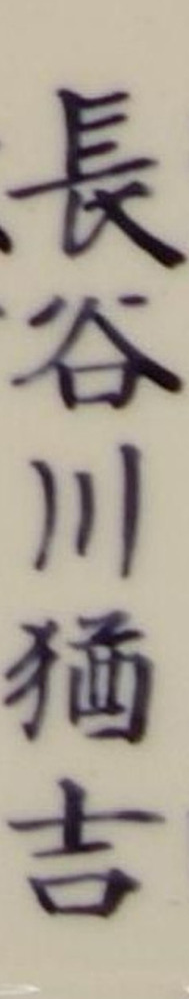長谷川猶吉
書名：M~S
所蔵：高野山金剛峯寺
